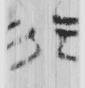行
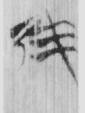隹
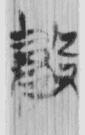{㱿子}
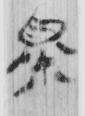眔
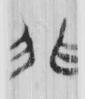非
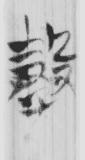{㱿子}
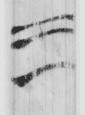王
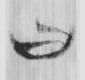曰
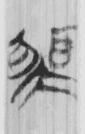{聑大}
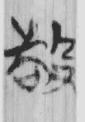敬
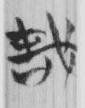哉
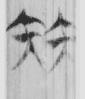{矢矢}
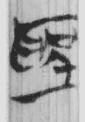聖
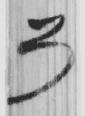乃
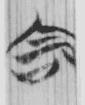命
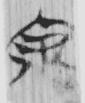余
